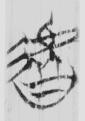{虍皆}
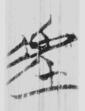𫊟
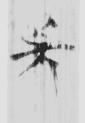先
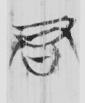君
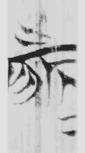之所=
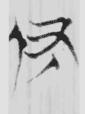付
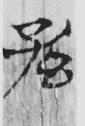孫
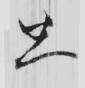也
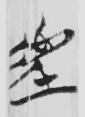𫊟
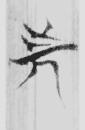先
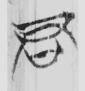君
